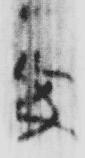交
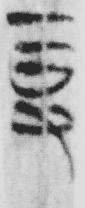○（得）
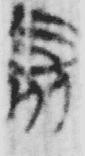衆
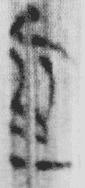近
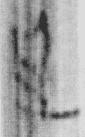從
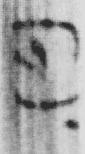正（政）
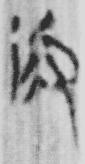攸（修）
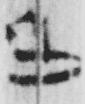身
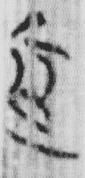近
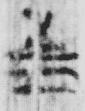至
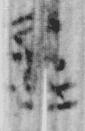○（仁）
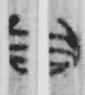同
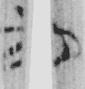方
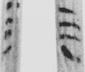而
